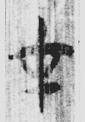才（在）
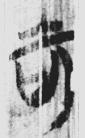可
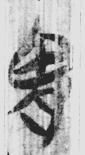胃（謂）
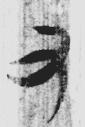又（有）
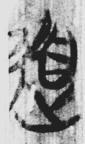道
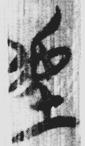○（乎）
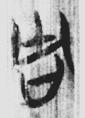周
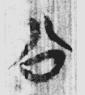公
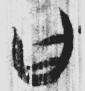曰
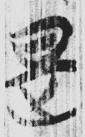是
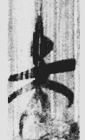夫
